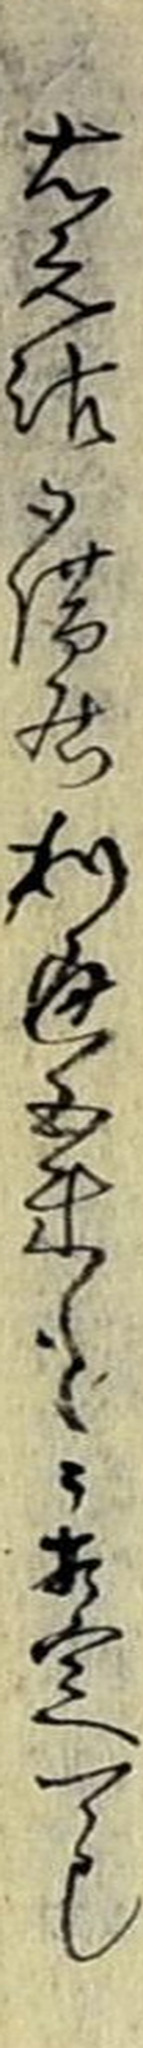右元銀御借居利通五朱つヽに相定可申候
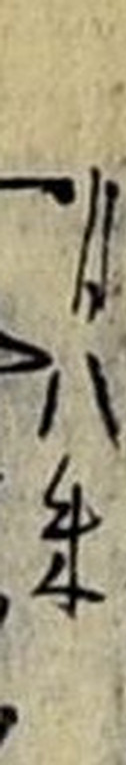月八朱
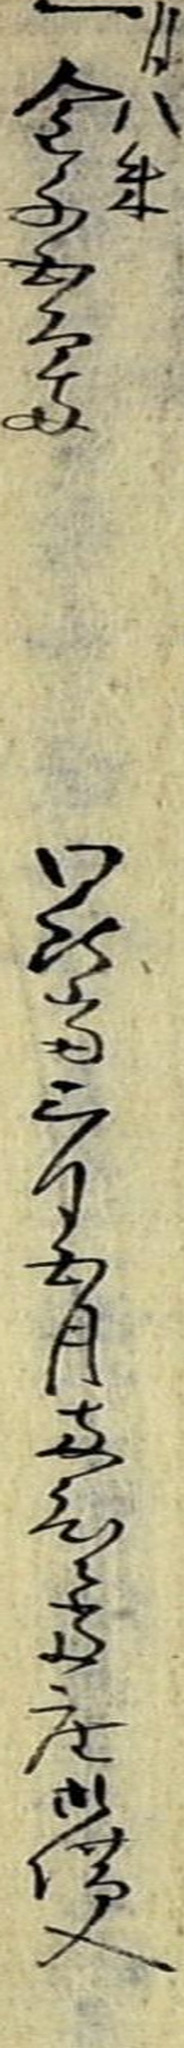一金千五百両同断当三月五月両度に当座御借入
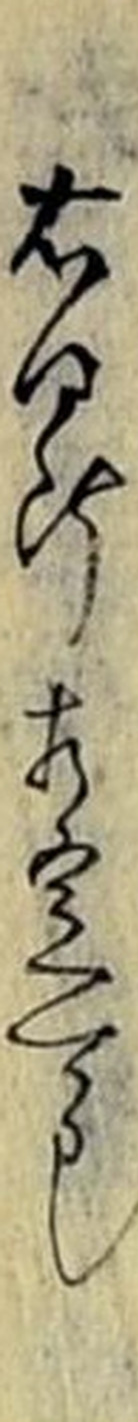右同断相定可申候
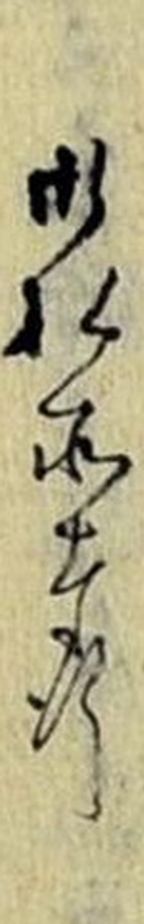御札所奉行
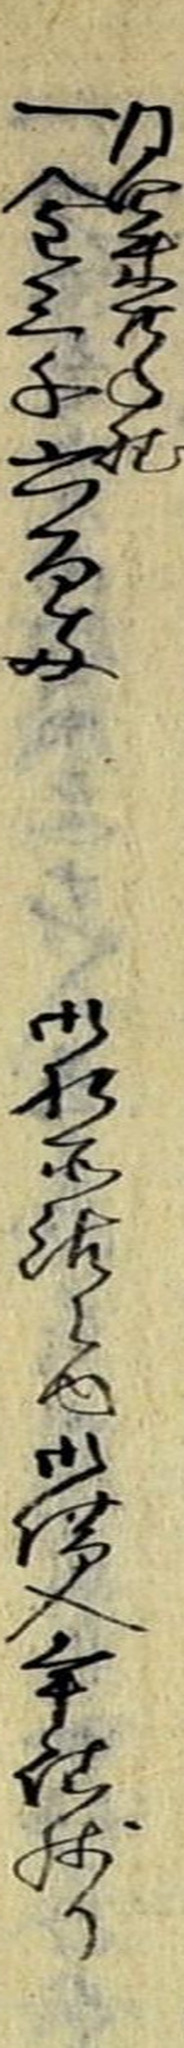一金三千六百両御札所銀之内御借入年賦残り
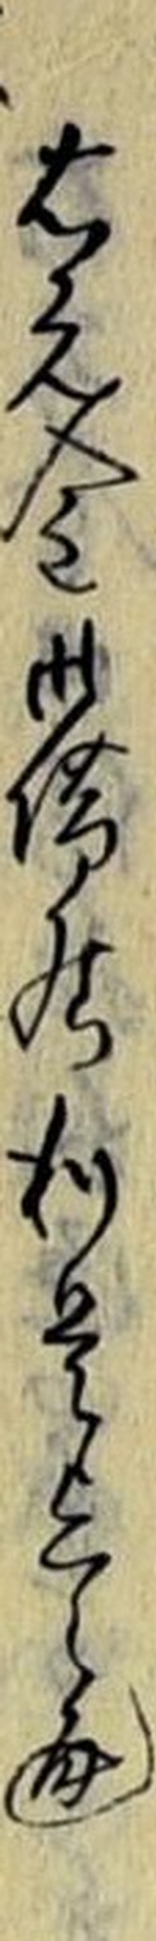右元金御借居利足是迄之通
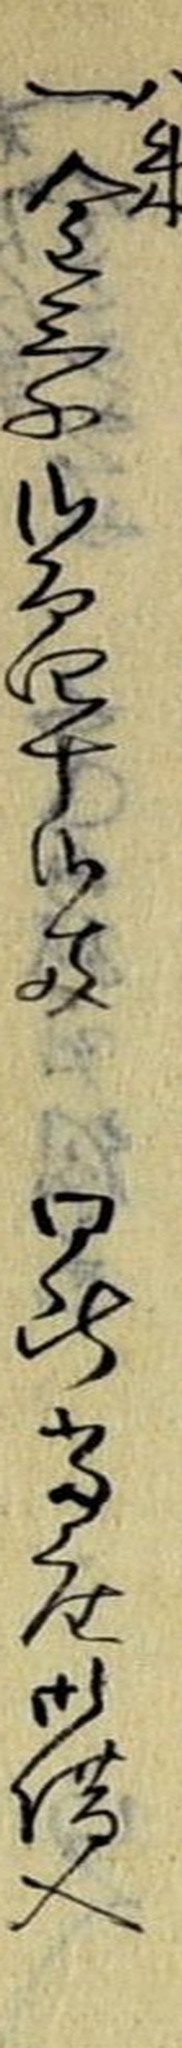一金三千弐百四十弐両同断当座御借入
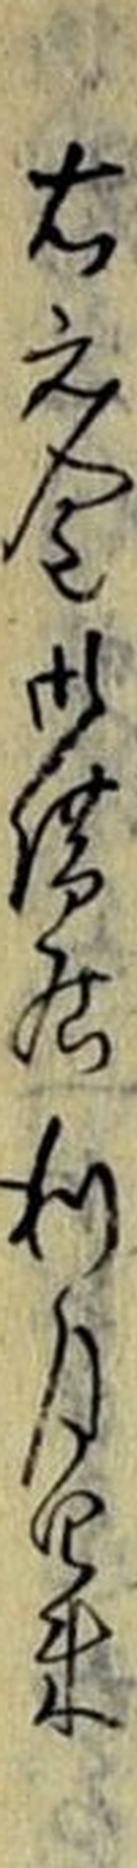右元金御借居利月四朱
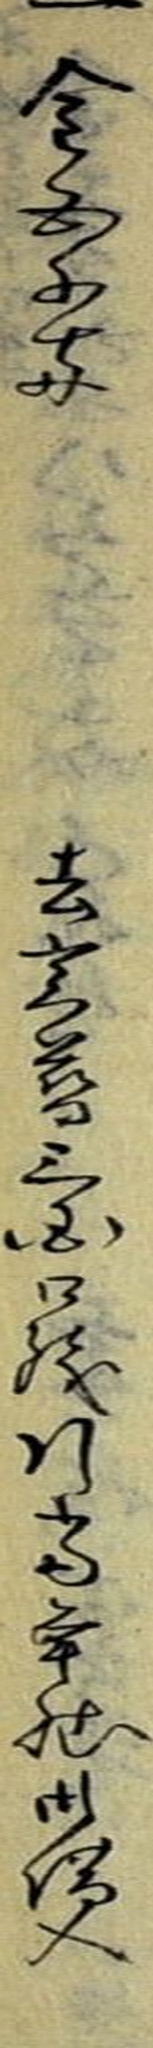一金五千両去亥暮三国口銭引当年賦御借入
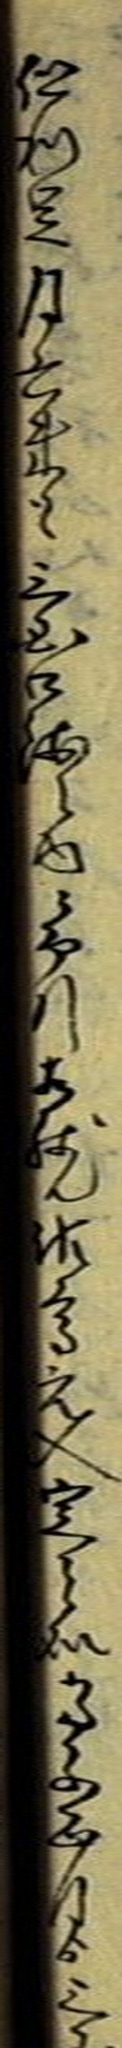但利足月六朱つヽ三国口銭之内に而引相残ル銀高元入定之処当子正月ゟ三国
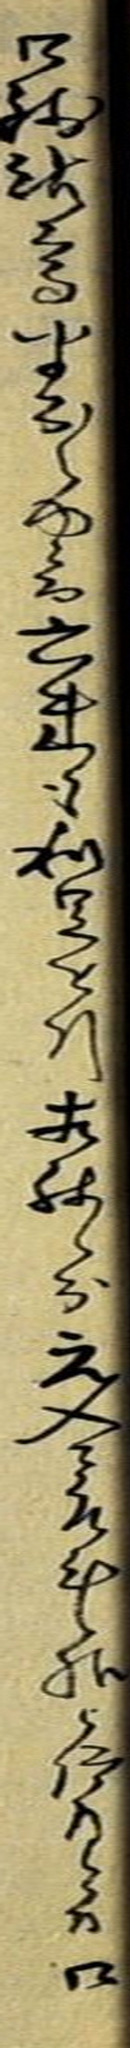口銭銀高半分之内に而六朱つヽ利足を引相残候分元入に取斗候様被仰付候に付口
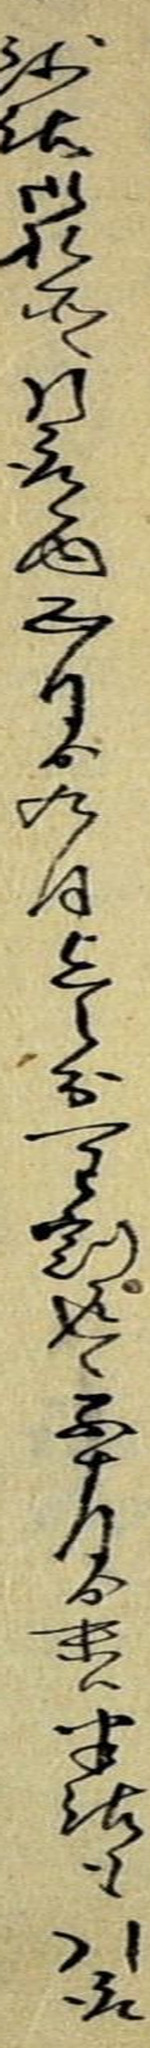銭銀御札所へ引取候内正月ゟ九月迄之分可被割込候子十月ゟ末は半銀つヽ引取
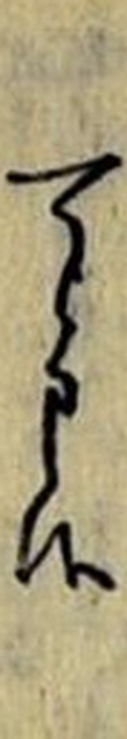可被申候
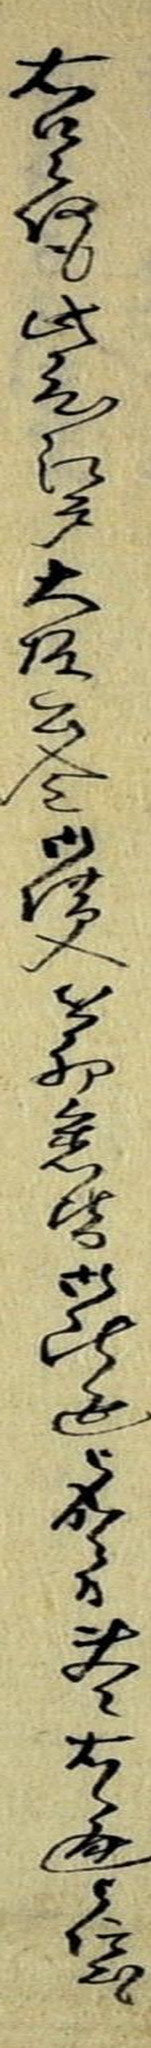右口々何も此度江戸大坂公金御借入を初悉皆御断延被成候に付夫々左之通被仰出候
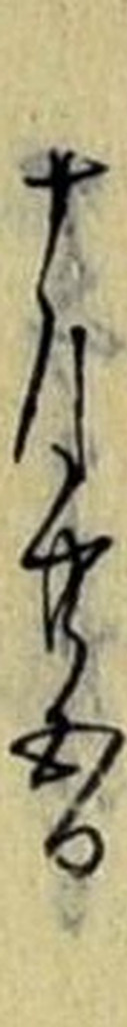十月廿五日
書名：命令之部 四
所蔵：福井県文書館 Fukui Prefectural Archives
